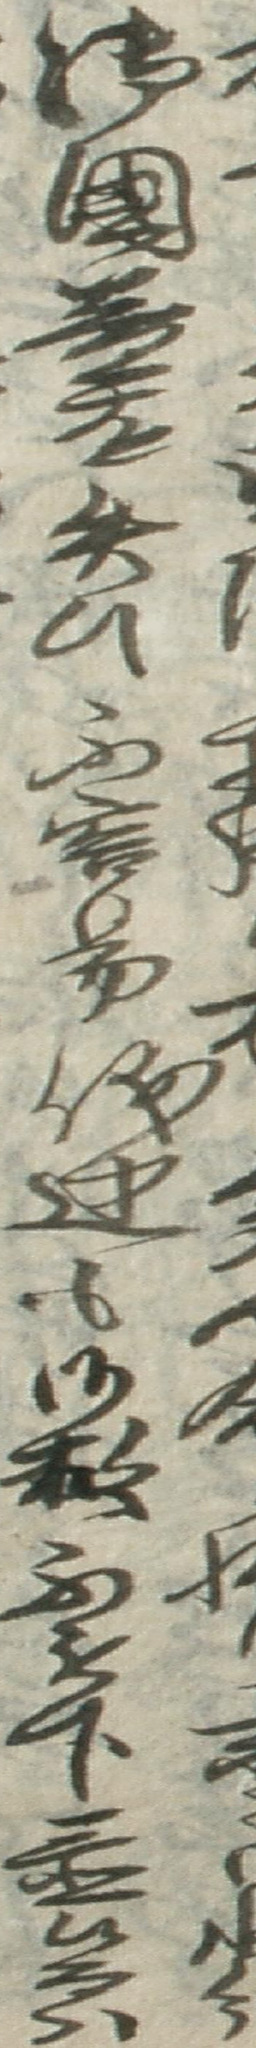御国益を失ひ不容易儀迚も御救不被下置候而は
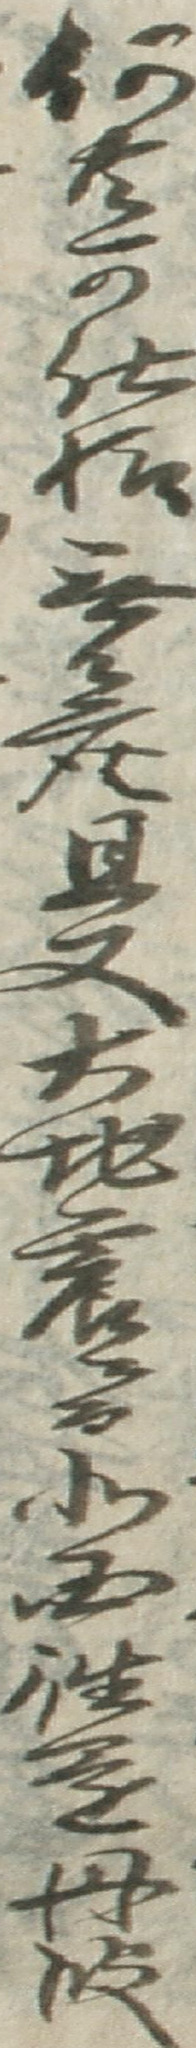何共可仕様無御座且又大地震二而北国往還丹波
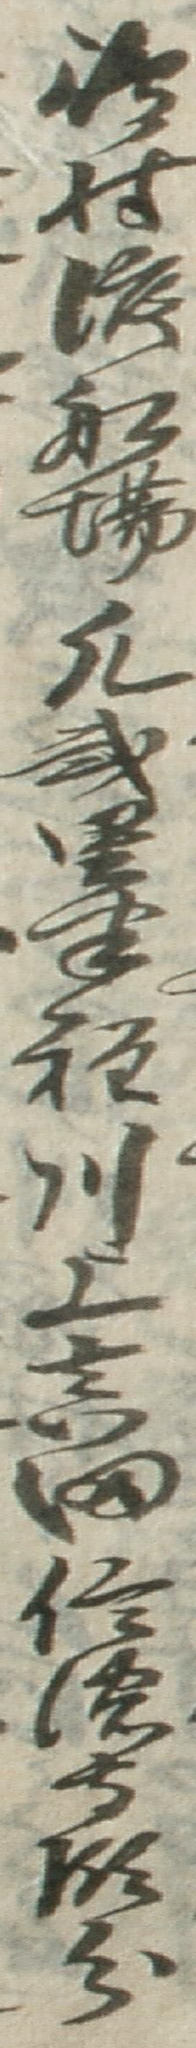嶋村渡船場凡弐里半程川上真田信濃守領分
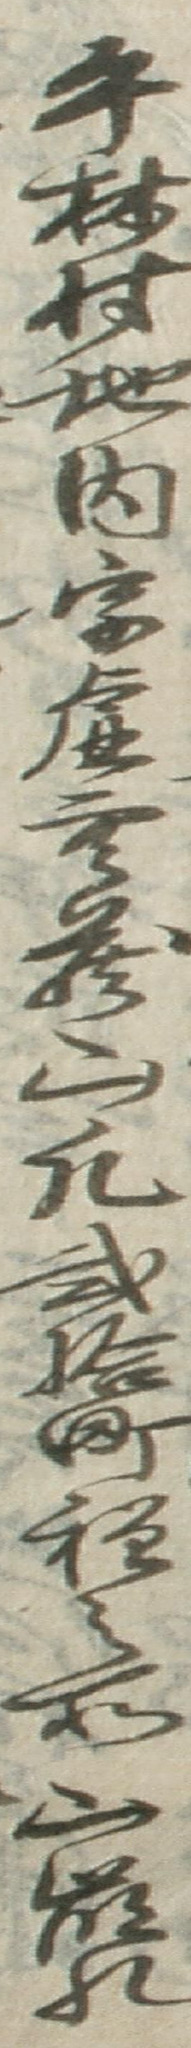平林村地内字虚空蔵山凡弐拾町程之所山崩れ
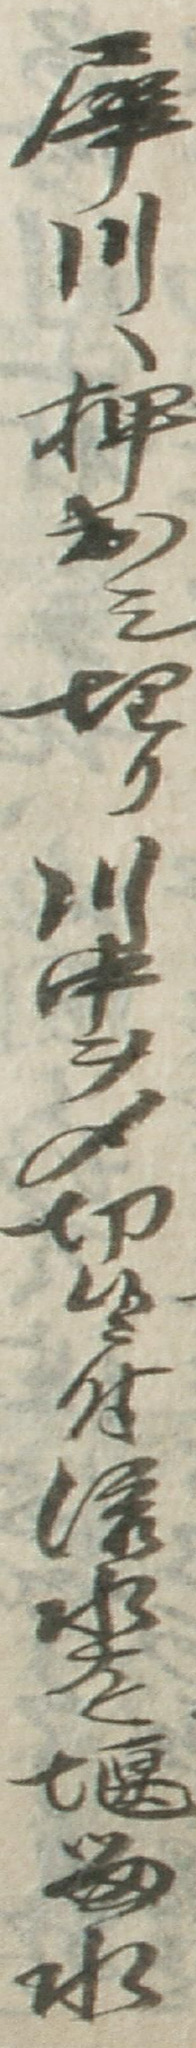犀川へ押出ㇱ埋り川中ヲ〆切候二付流水を堰留水

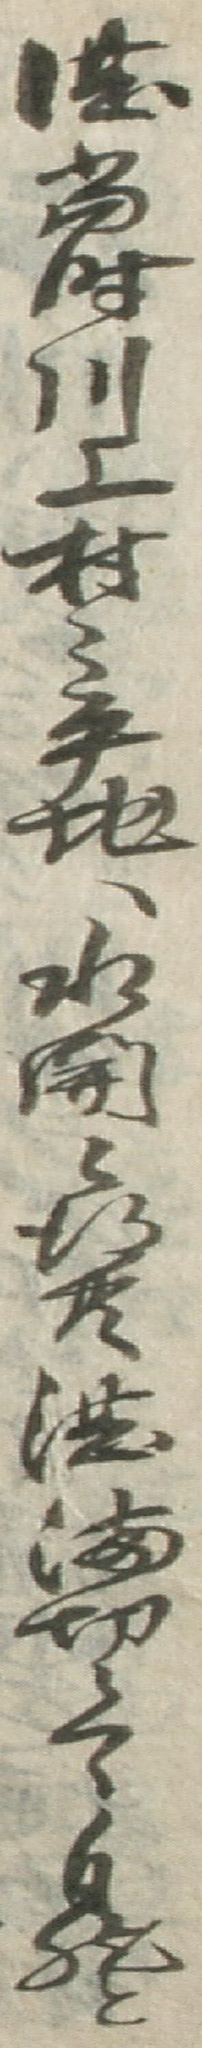湛当時川上村々平地ㇸ水開候得共湛留切候ハゝ自然と
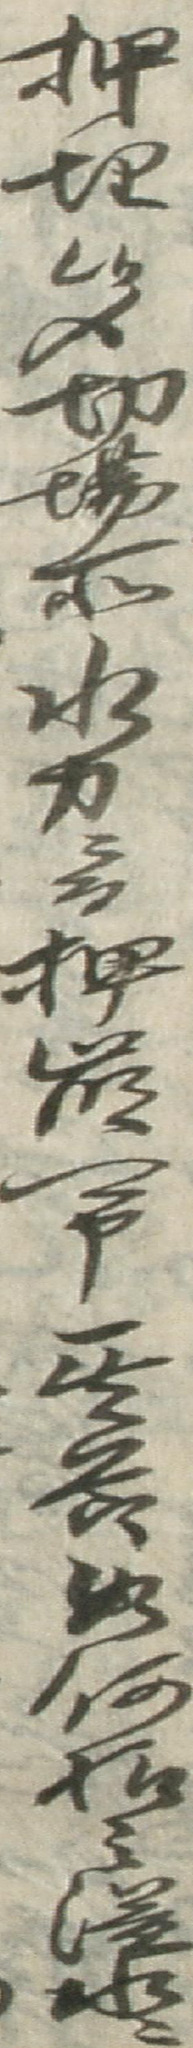押埋口〆切場所水力二而押崩可申其節如何様之溢水二
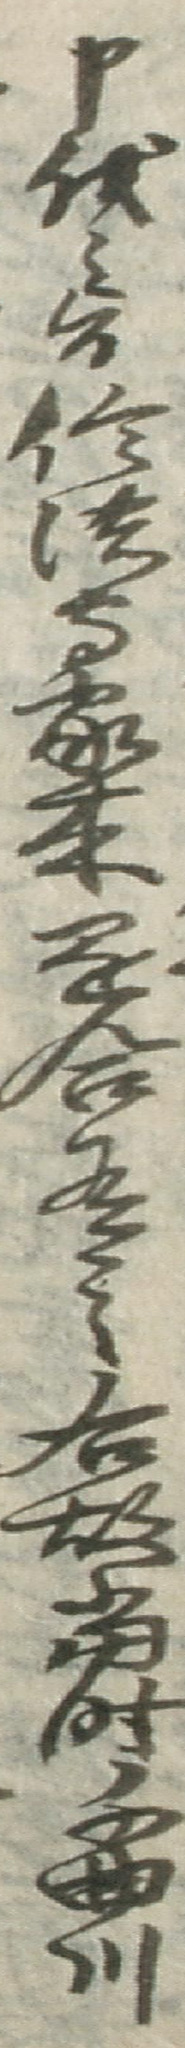申儀之旨信濃守家来掛合有之右故当時千曲川
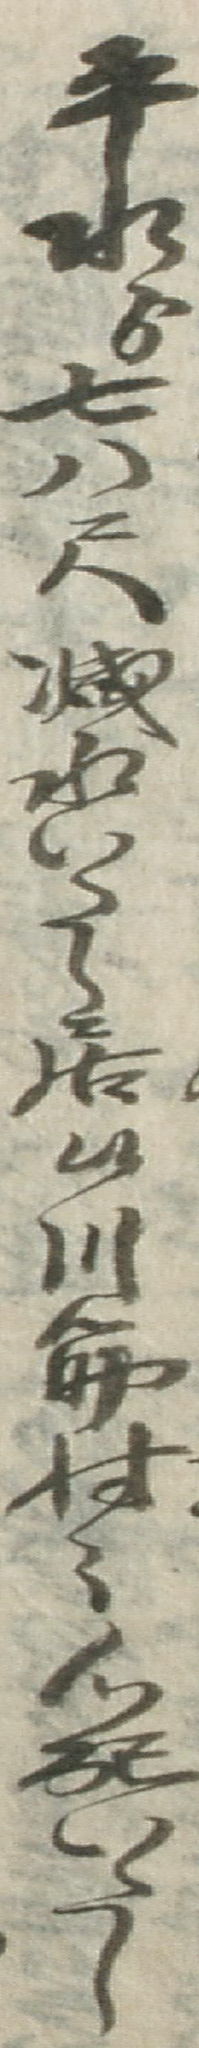平水ゟ七八尺減水いたし居候川筋村々心配いたし
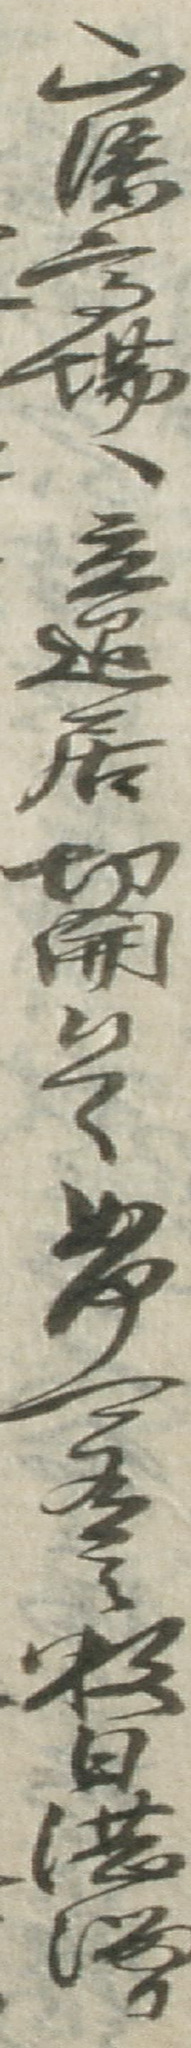山添高場江立退居切開候ハゝ如何可有之数日湛溜り
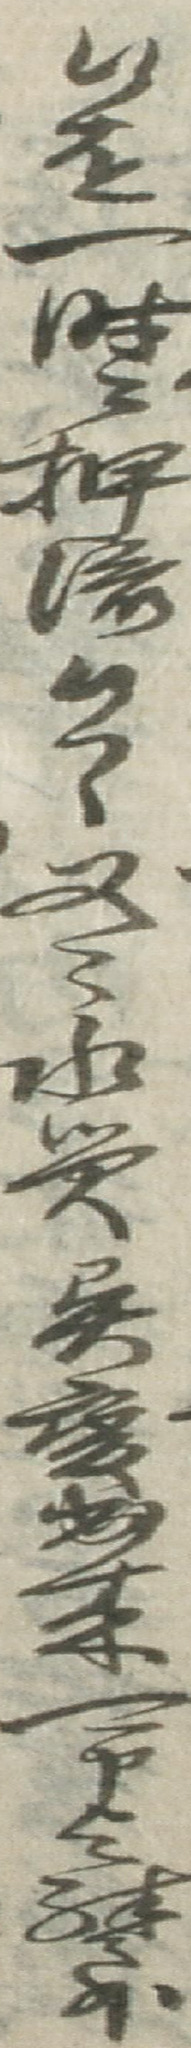候を一時二押流候ハゝ又々水災異変出来可申と殊之外
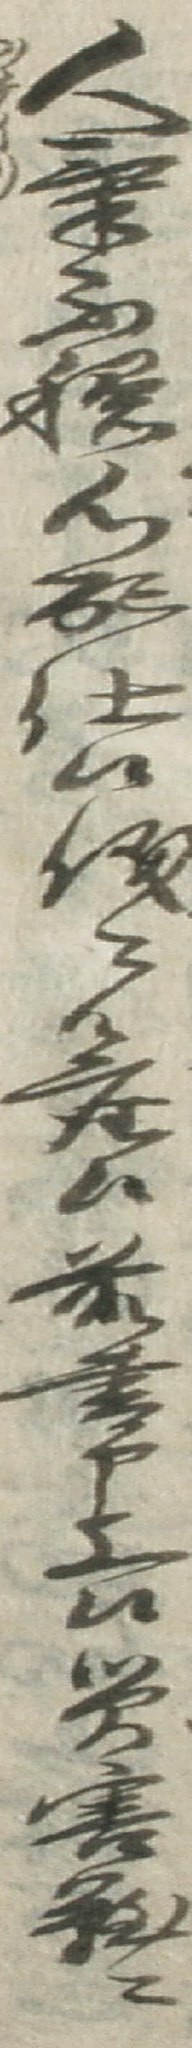人気不穏心配仕候儀二御座候前書申上候災害難二
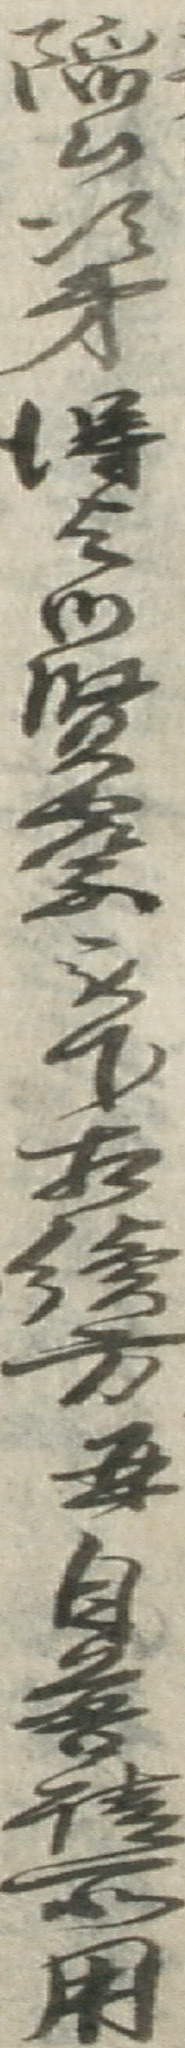陥候次第得と御賢察被下相続方并自普請所用
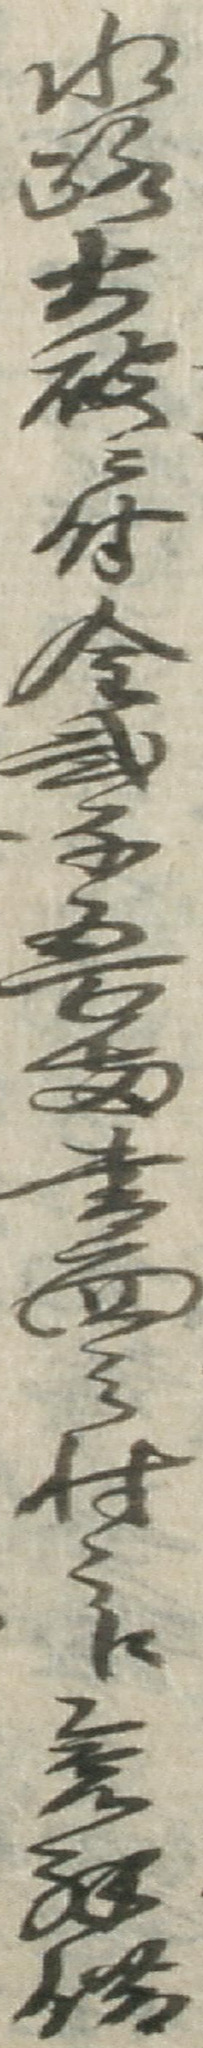水路大破二付金弐千五百両書面之村々江急拝借
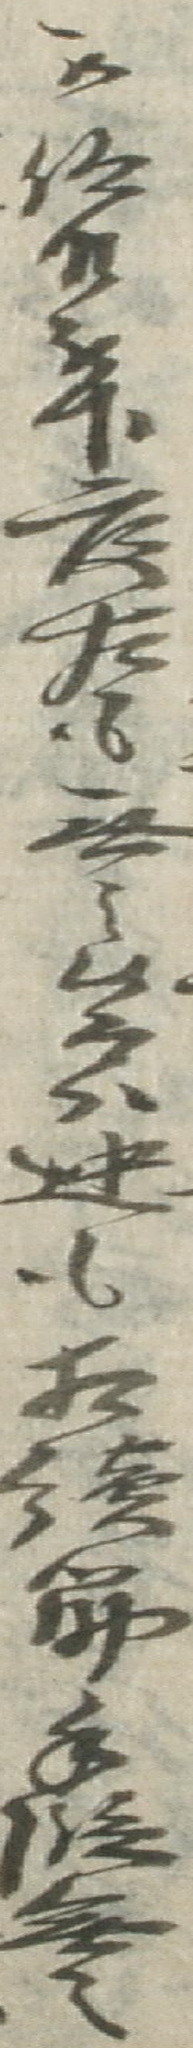仰付被下度左も無之候而ハ迚も相続筋手段無之
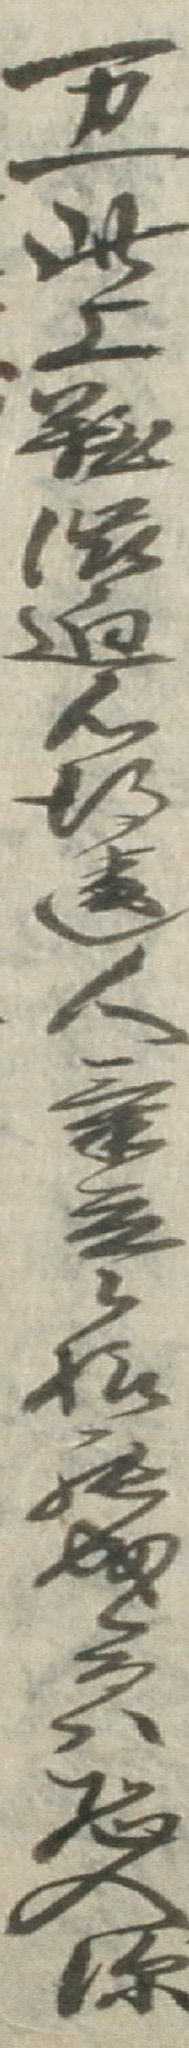万一此上難渋迫心得違人気立候様被成候而ハ恐入深
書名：信濃國地震實録記
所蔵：東京大学地震研究所図書室 Earthquake Research Institute Library, The University of Tokyo, JAPAN
